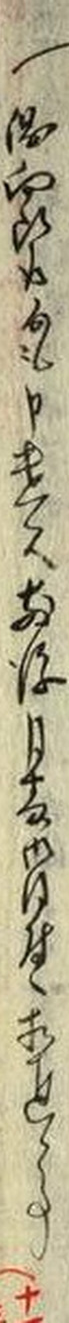側向頭取ゟも申遣ス前後月番御目付へ相達候事
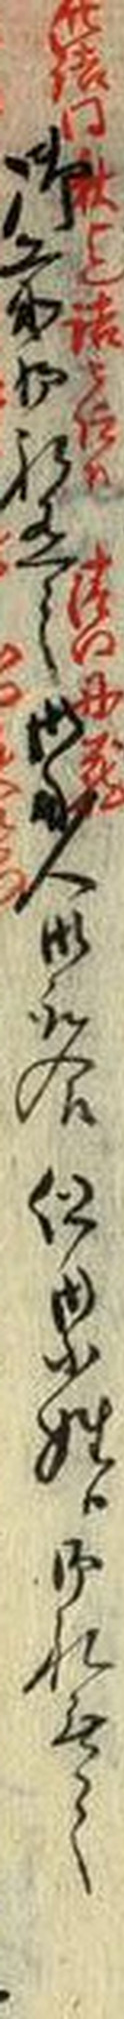御前御礼有之御用人御取合但御小姓ハ無之
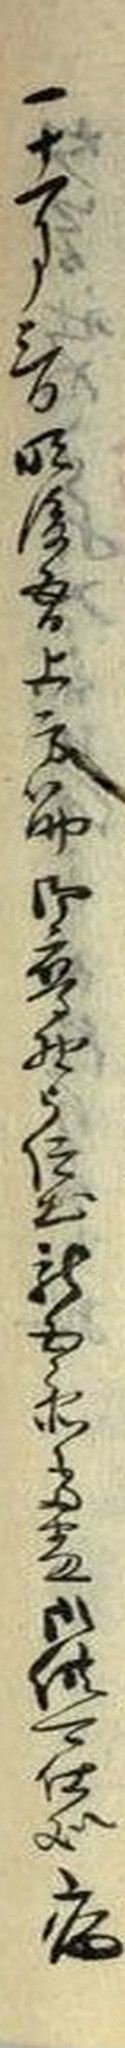一十一月三日明後五日上方筋御鷹野被仰出新五兵衛当番御供可仕処病
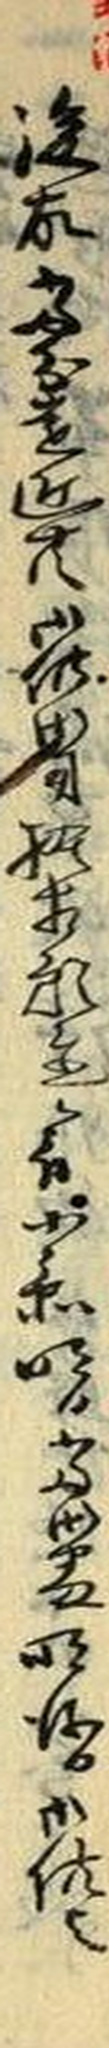後故当分遠近共御供御用捨相願置候ニ付小兵衛明日当御番明後日御供与
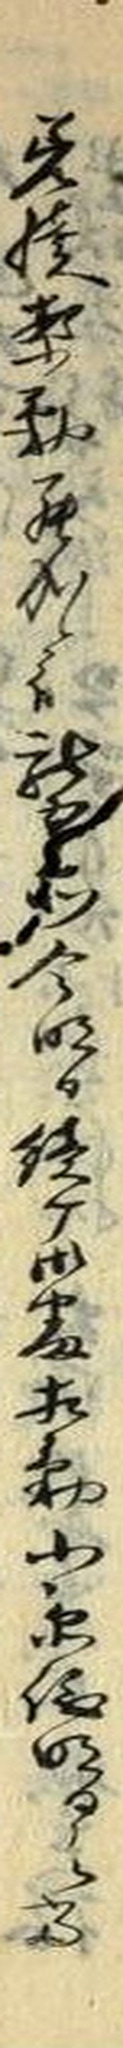差続繫勤罷成候ニ付新五兵衛今明日続ケ御番相勤小兵衛儀明日之当
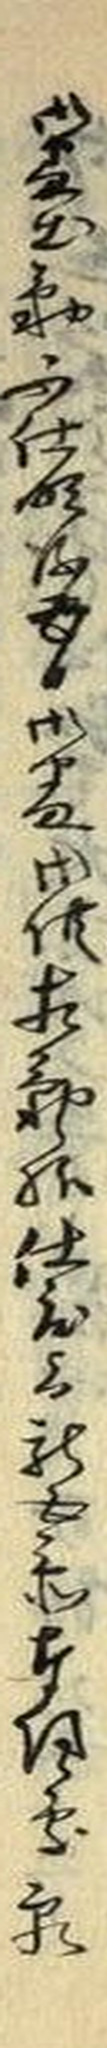御番出勤不仕明後五日御番御供相勤候様仕度旨新五兵衛奉伺候処願
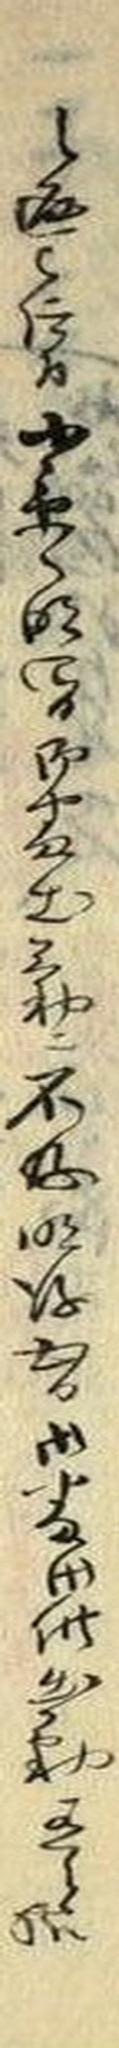之通被仰付小兵衛へ明四日御番出勤ニ不及明後五日御番御供出勤有之候様
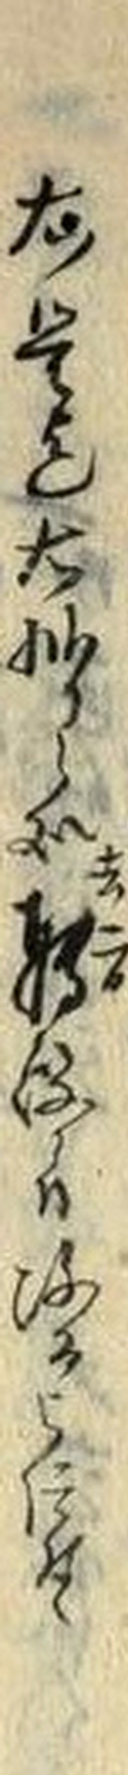右是迄右掛り之処去二日転役ニ付改而被仰付候
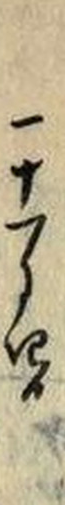一十一月四日
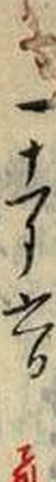一十一月六日
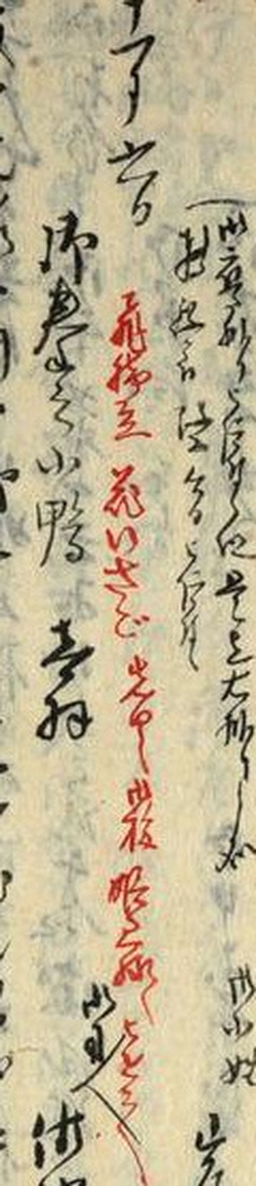飛脚立花いさご先日之御移姫君様へ被進之
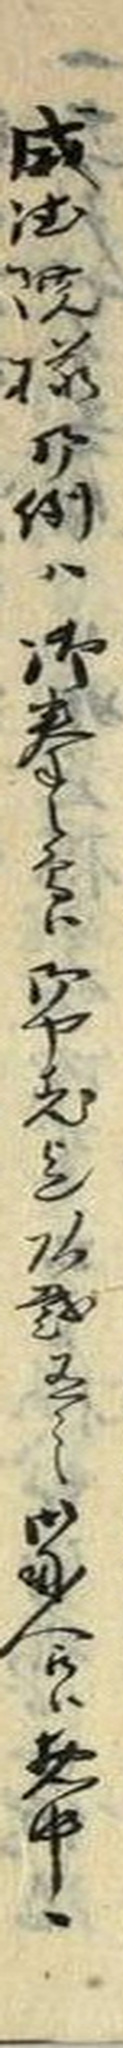威徳院様御例ハ御拳之鳥ハ御中老迄頂戴有之御用人江ハ惣中へ
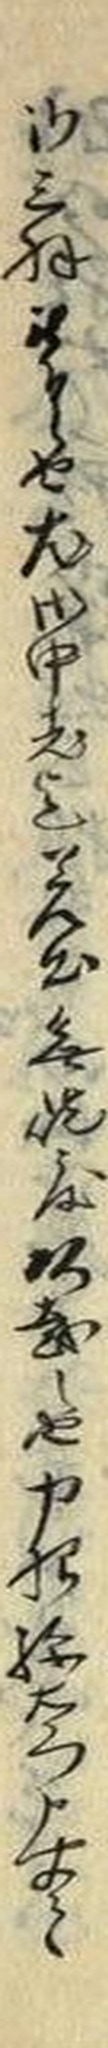弐三羽被下之由尤御中老迄差出無屹度頂戴之由中根孫右衛門申聞之
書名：少傅日録抄（斉承付側向頭取日記、在国）
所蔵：福井県文書館 Fukui Prefectural Archives
